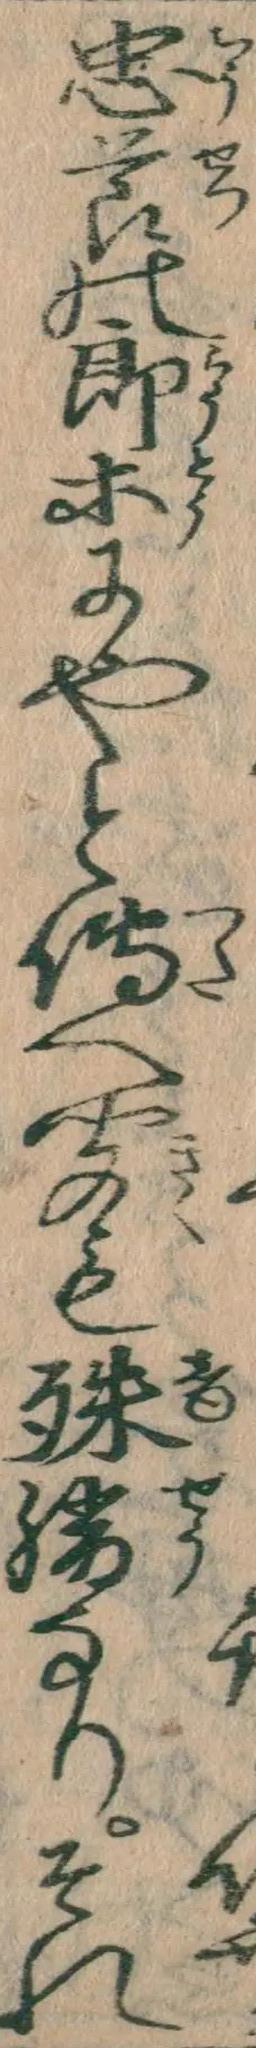忠節の郎等にやと伝へ聞も殊勝なり。それ
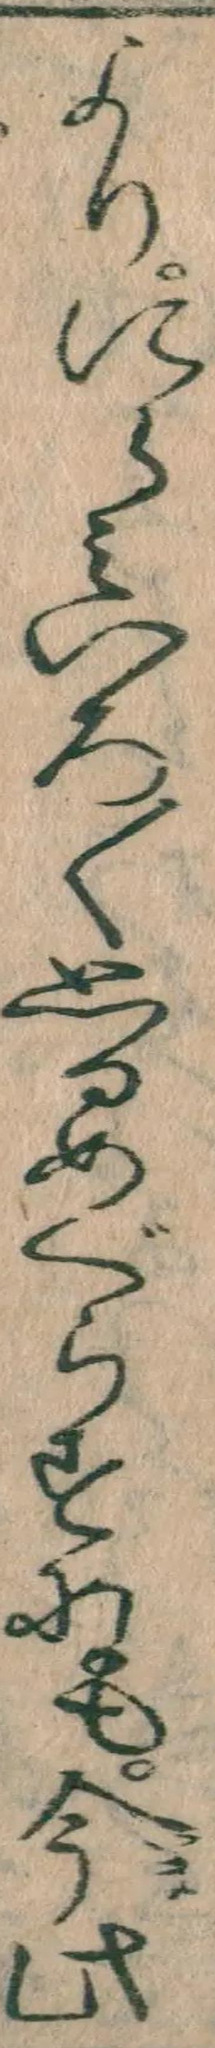より。にらみいろ〳〵思ひめぐらすにも。今此
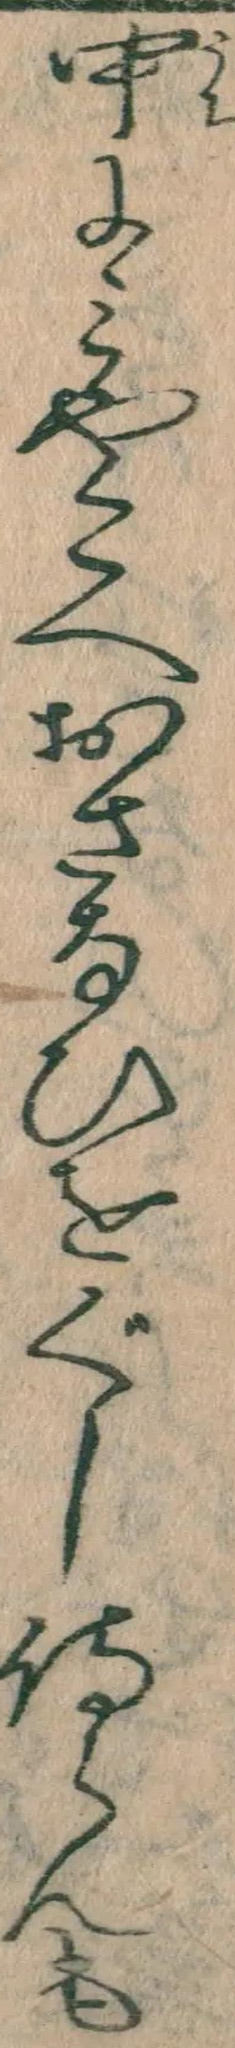中にみやこへおさなひをぐし侍らんも
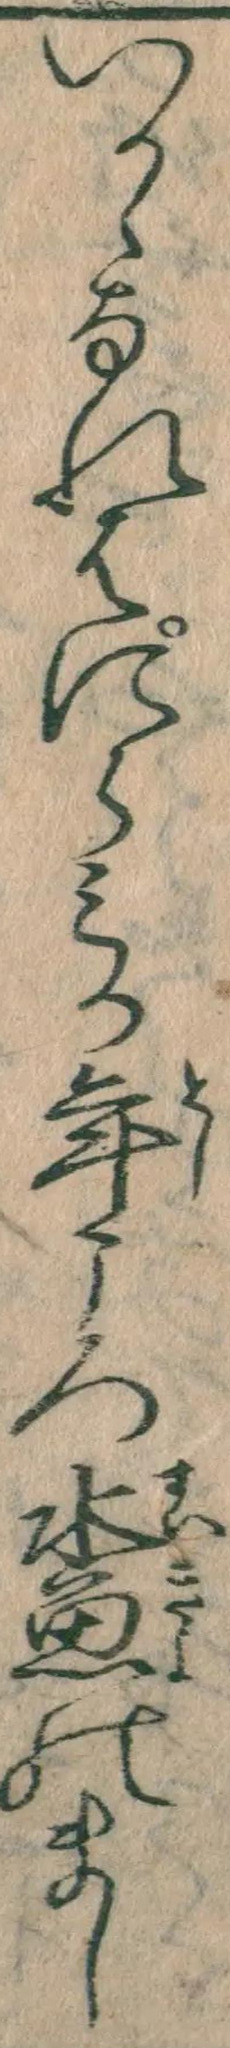いかゝなれは。にらみか年ころ水魚のまし
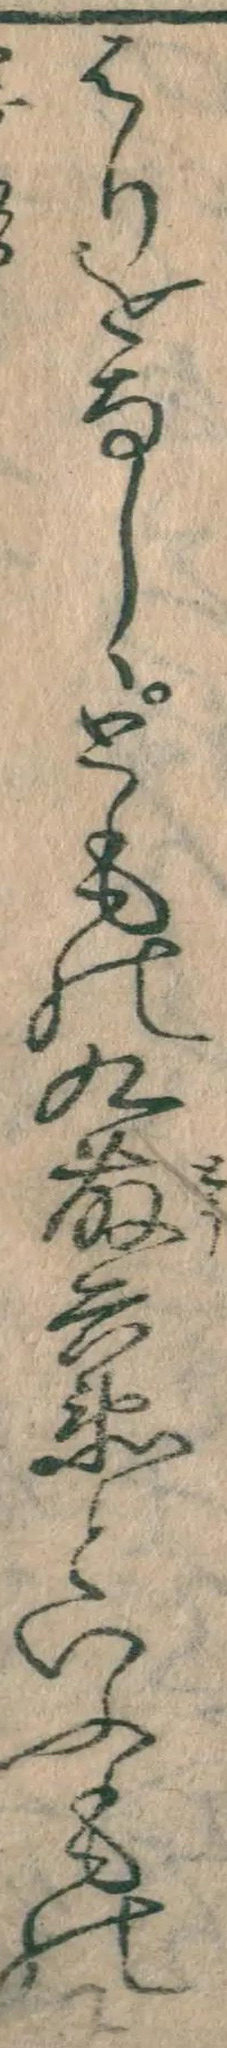はりをなし候。ともの九藤兵衛といふものに
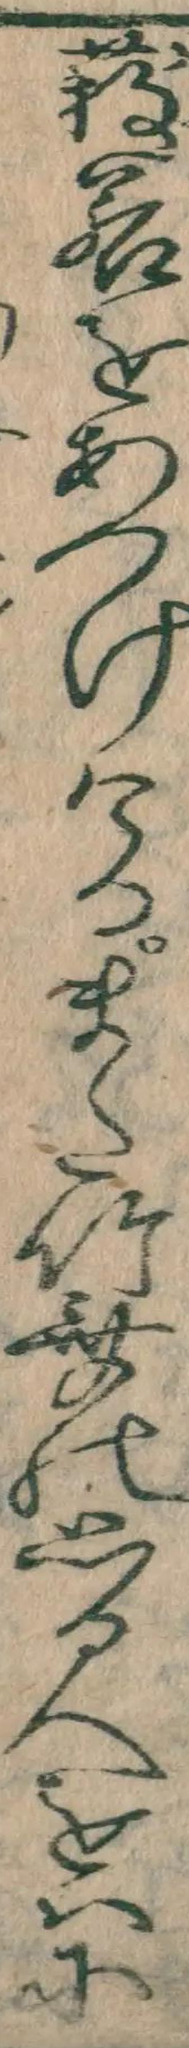藪若をあつけける。また竹斎の思ひ人をはに
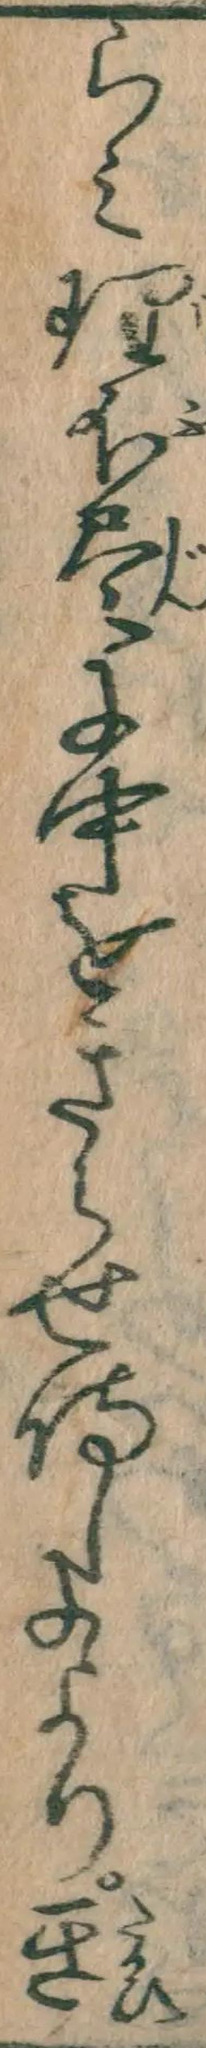らみ理不尽に中をきらせ侍しにより。互

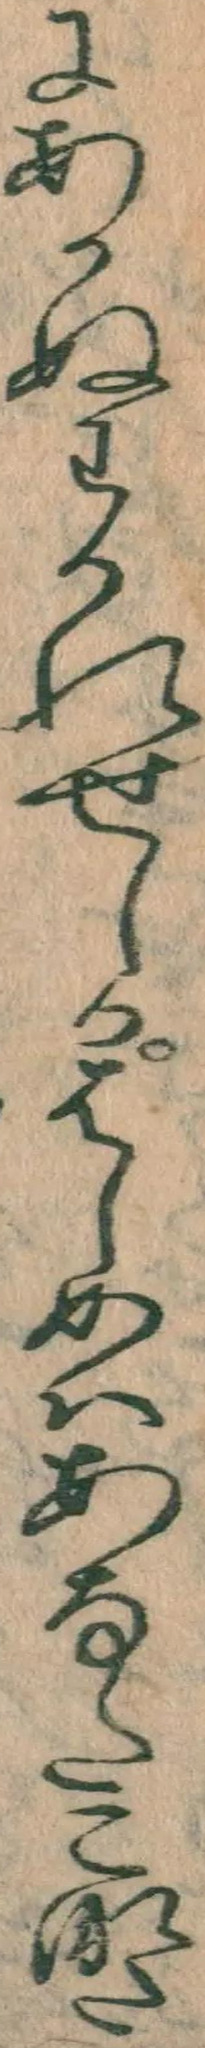にあかぬわかれせしか。はしめはあなたこなた
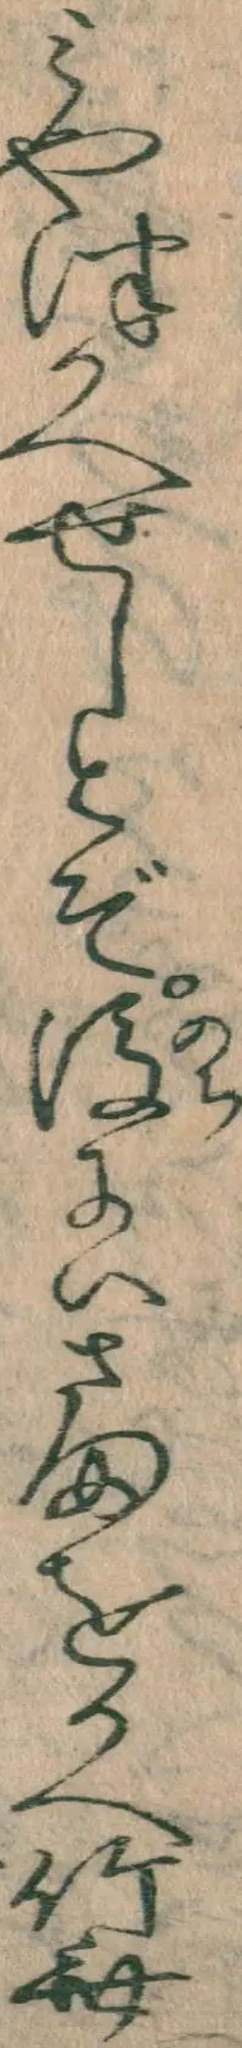みやつかへせしとぞ。後にはさまをかへ竹斎
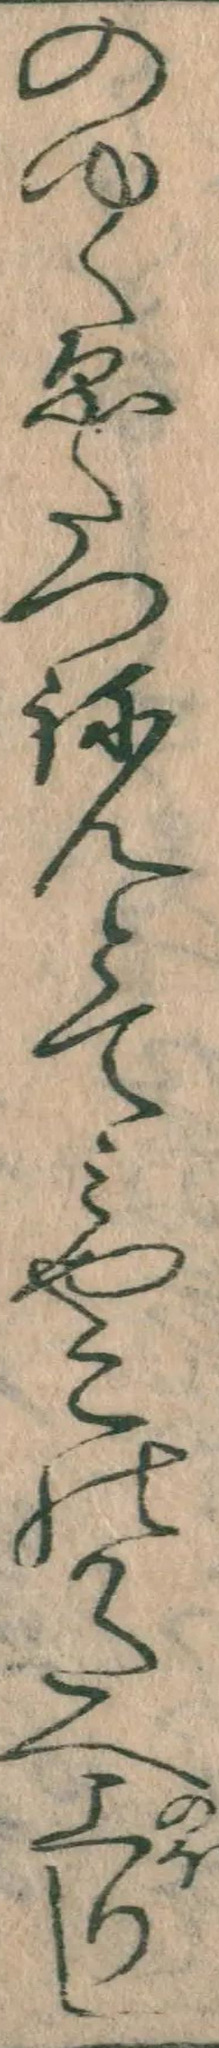のゆくゑたつねんとてみやこのかたへ上りし
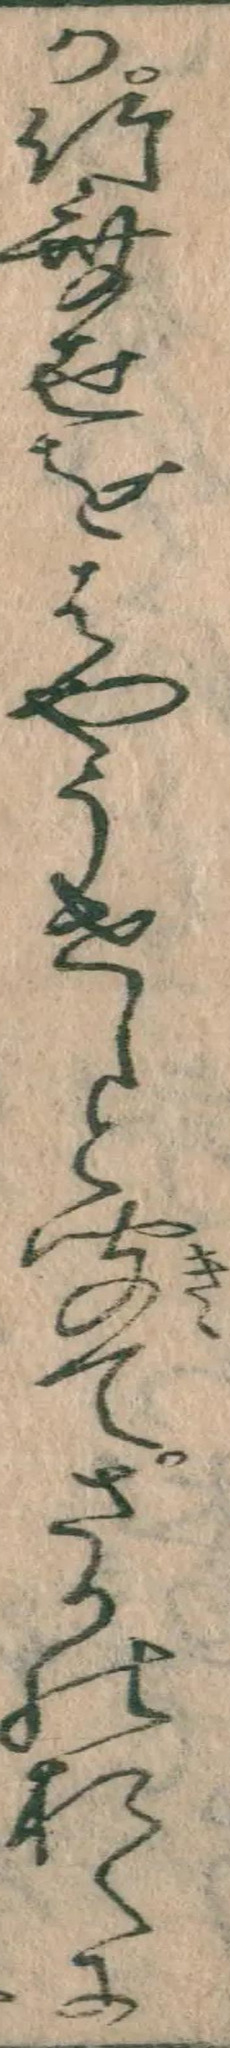か。竹斎世をはやうせしと聞て。さかのおくに
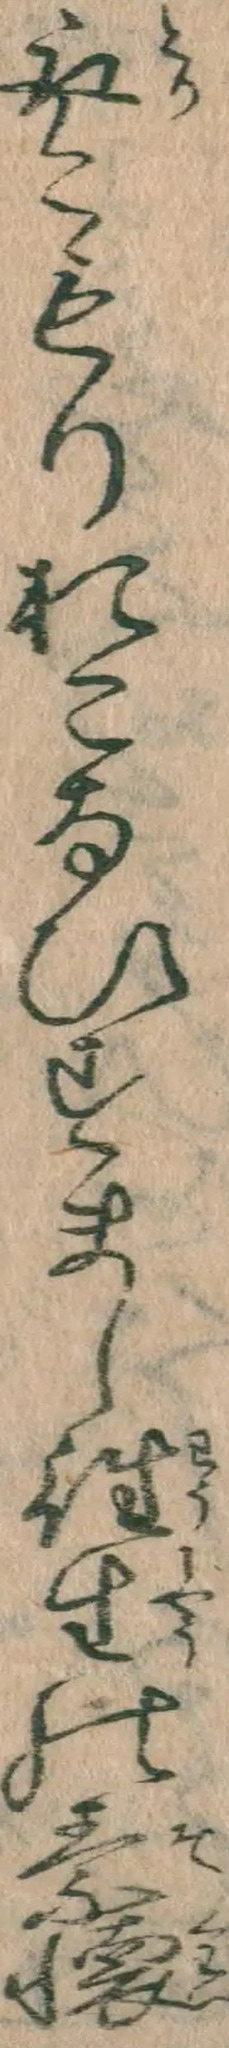取こもりおこなひすまし往生の素懐
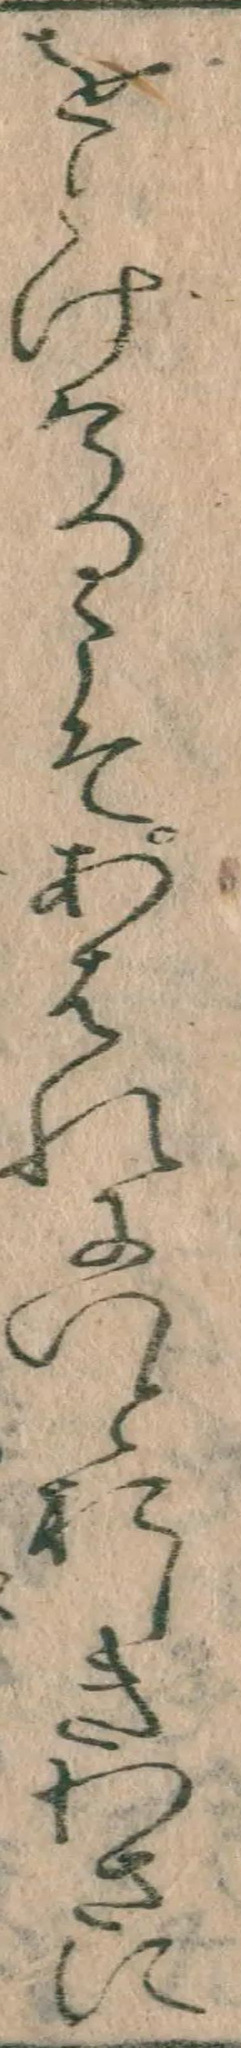をとけけるこそ。あはれにいとおしきわさに
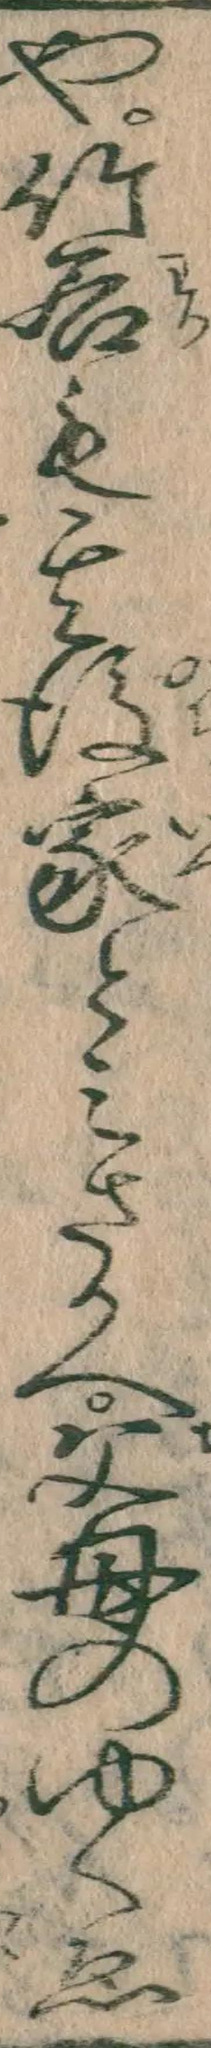や。竹若も其後家とみさかへ。父母のゆくゑ
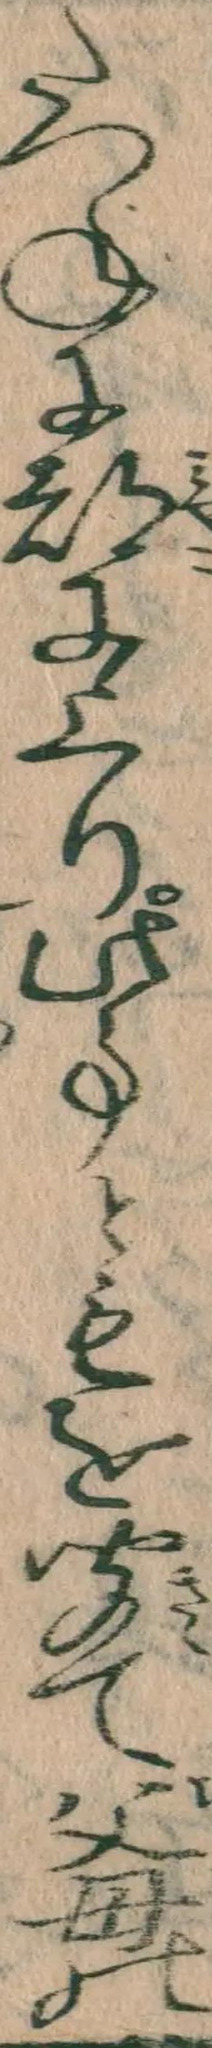たつねに都に上り。此事ともを聞て父母の
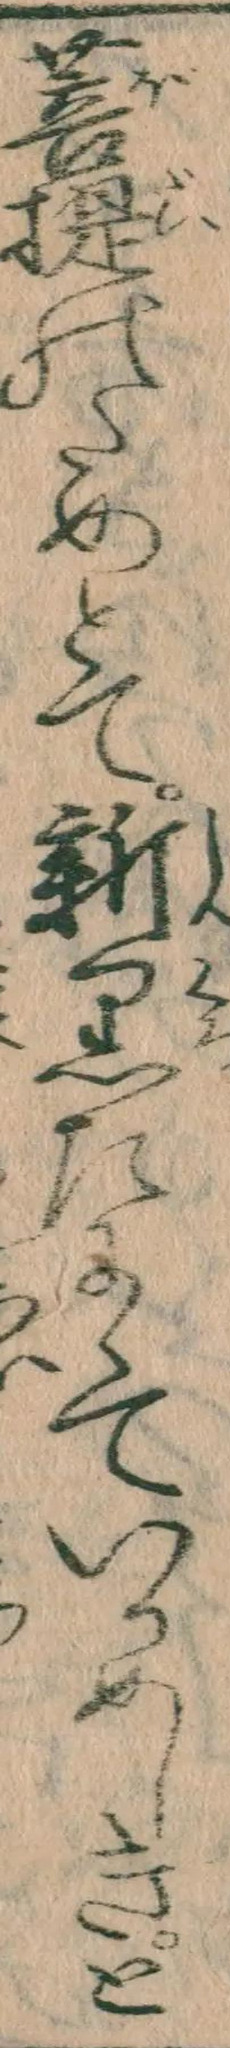菩提のためとて。新黒たにゝていかめしき。と
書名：竹斎狂歌物語 3巻
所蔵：国立国会図書館 National Diet Library, JAPAN
